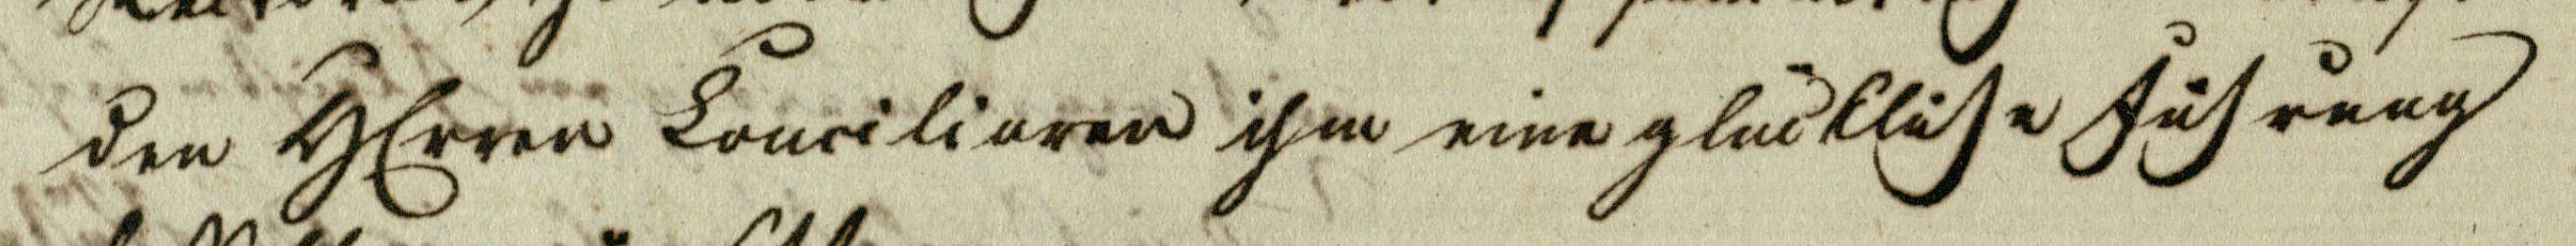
den Herren Conciliaren ihm eine glückliche Führung
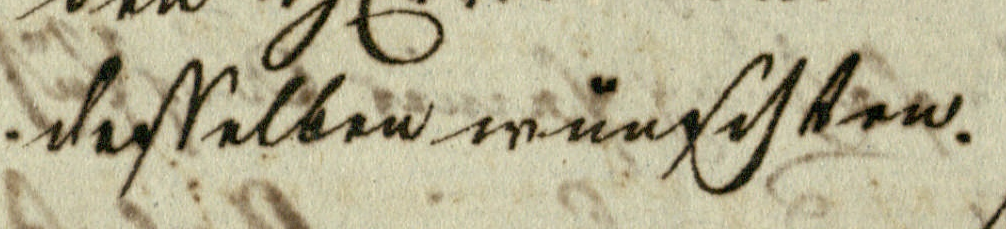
desselben wünschten.
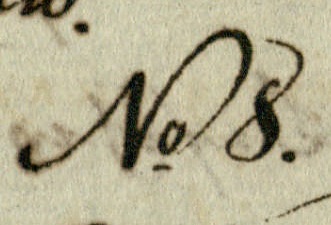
No 8.
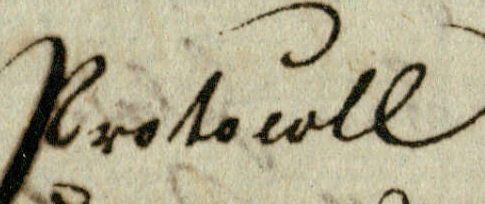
Protocoll
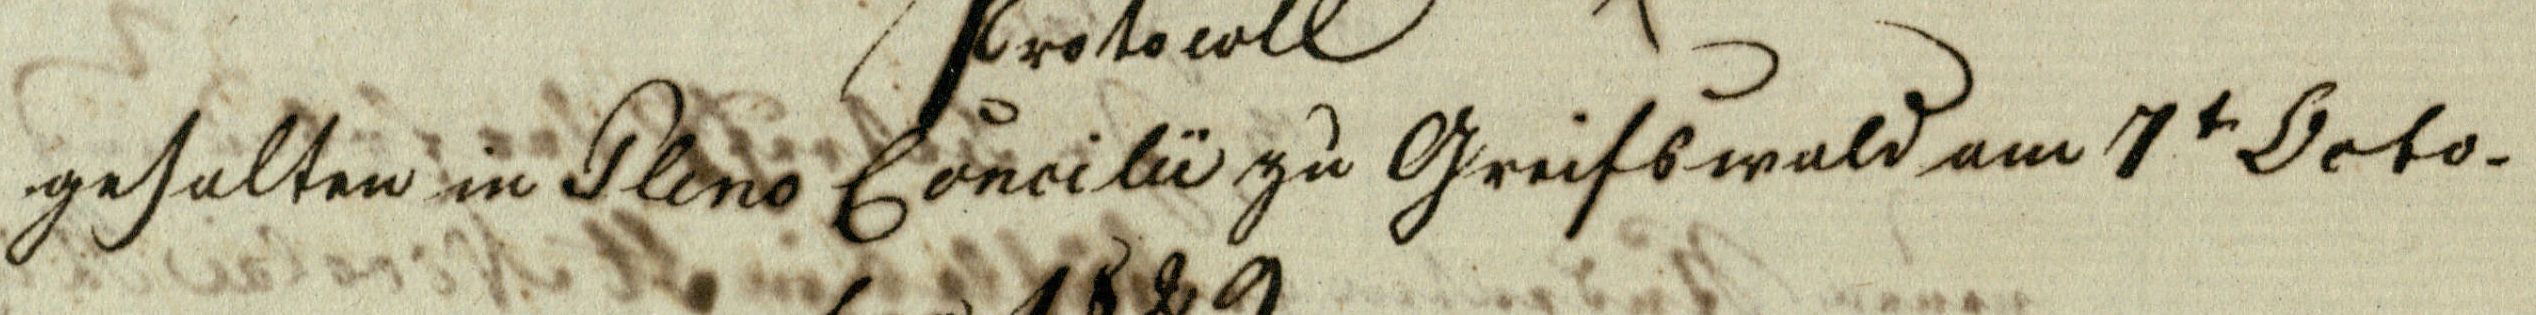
gehalten in Pleno Concilii zu Greifswald am 7 t Octo¬
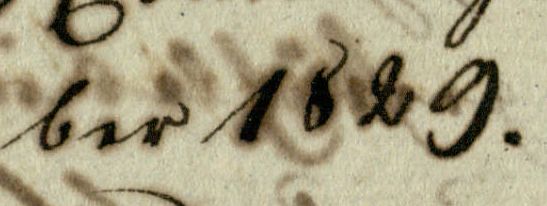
ber 1829.
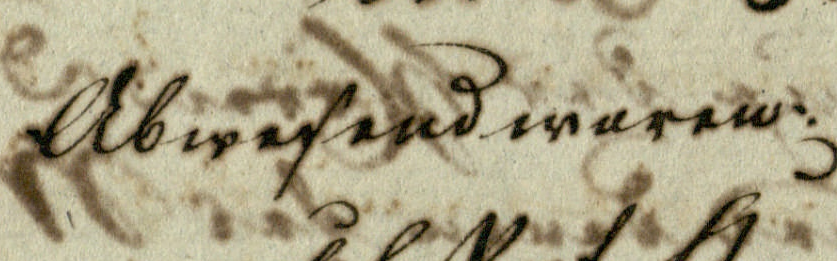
Abwesend waren:
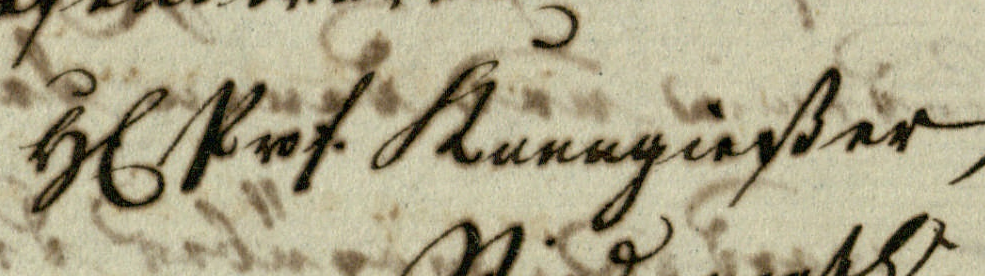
H Prof. Kanngießer
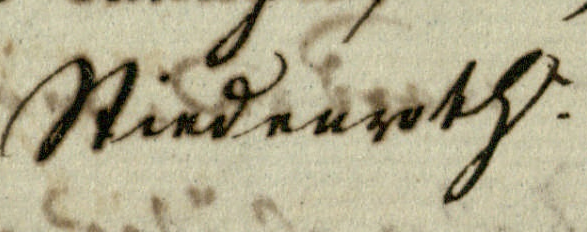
Stiedenroth.
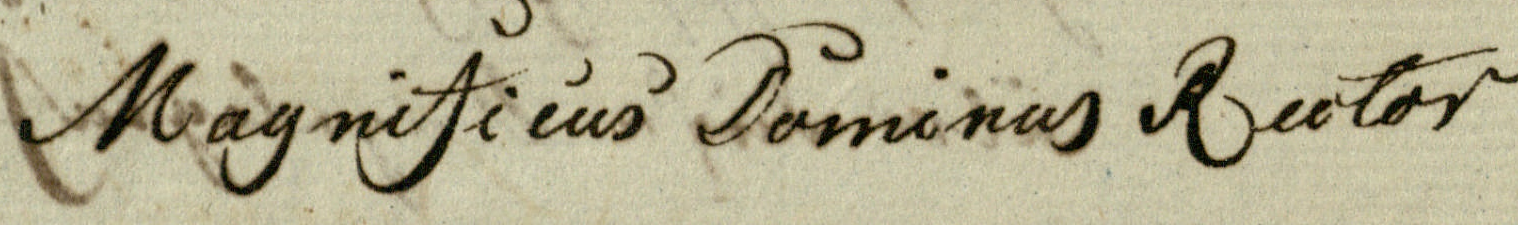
Magnificus Dominus Rector
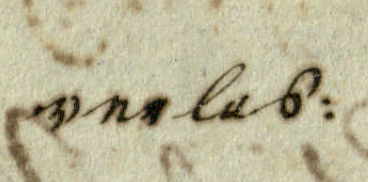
verlas:
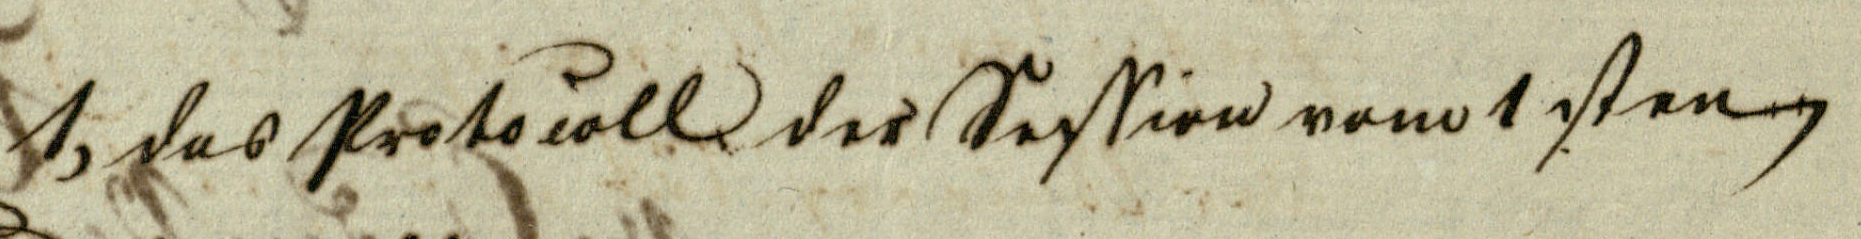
1, das Protocoll der Session vom 1sten
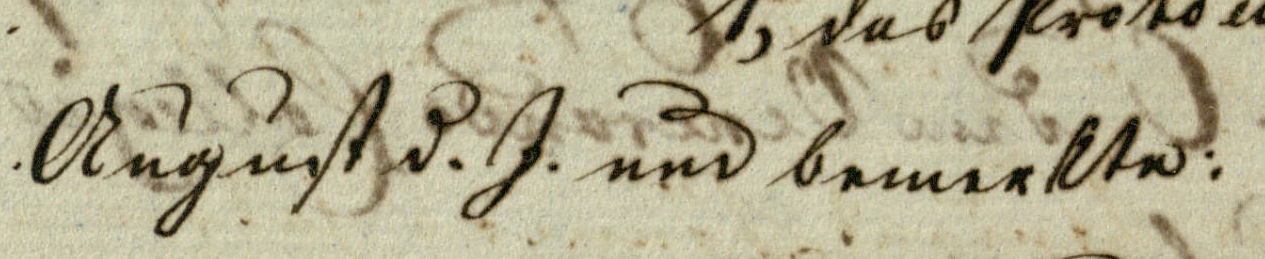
August d. J. und bemerkte:
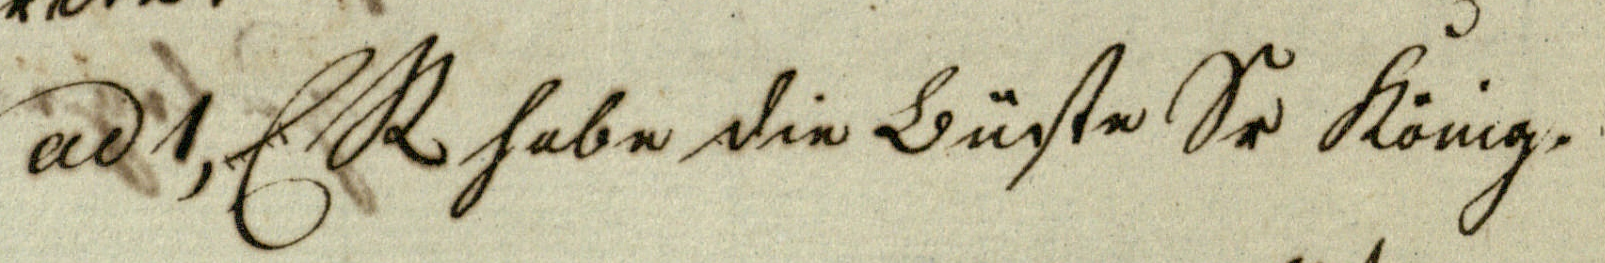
ad 1, E R habe die Büste Sr König¬
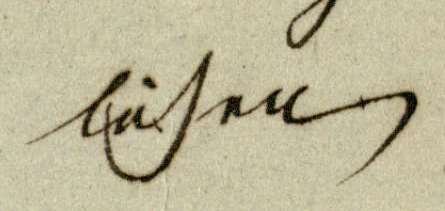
lichen
